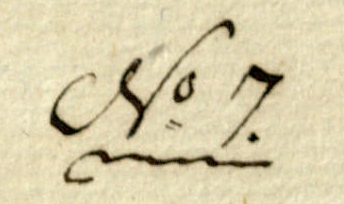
Nº 7.
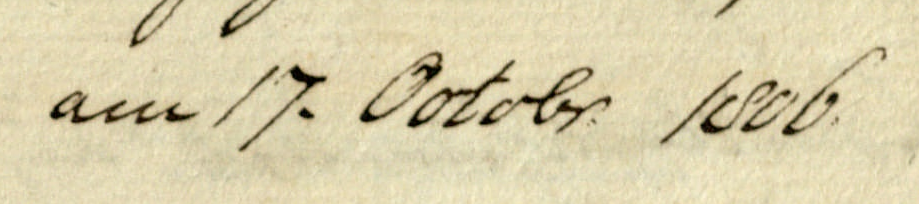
am 17. Octobr. 1806
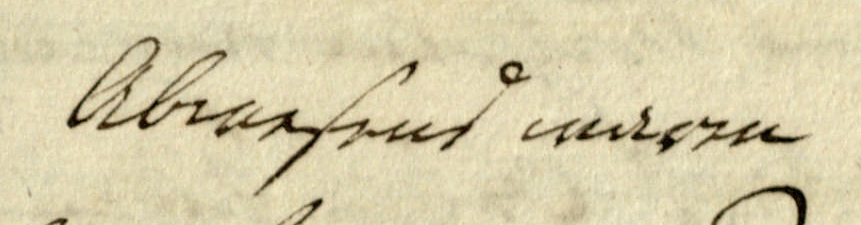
Abwesend waren
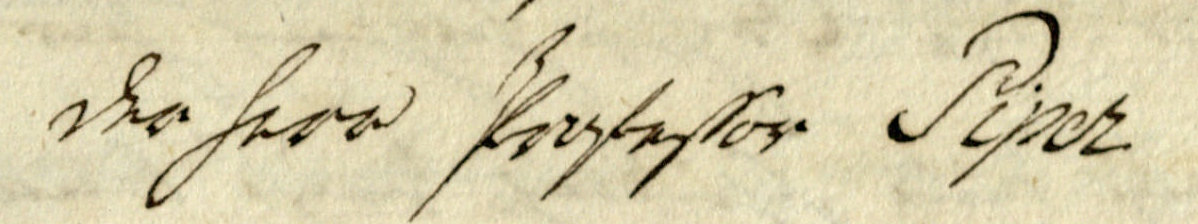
der herr Professor Piper.
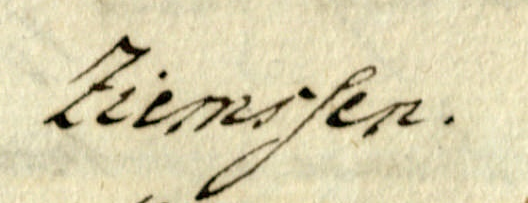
Ziemssen.
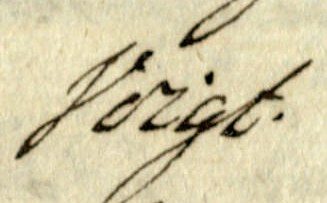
Voigt.
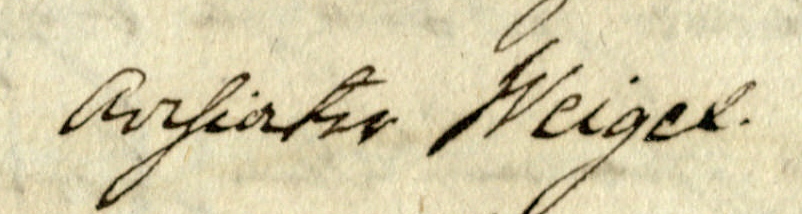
Archiater Weigel.
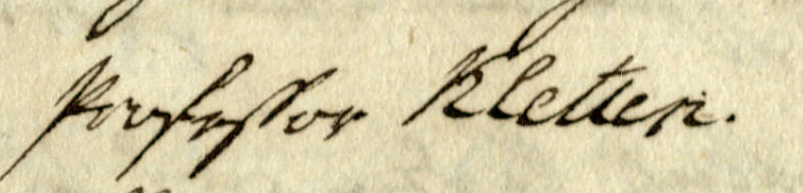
Professor Kletten.
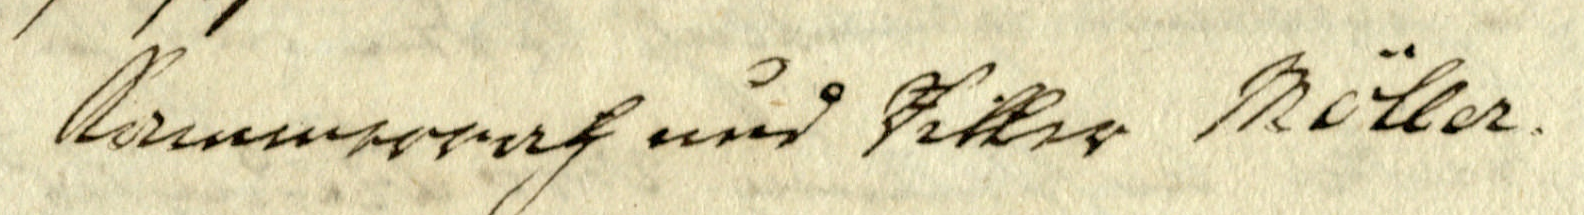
Kammerrath und Ritter Möller
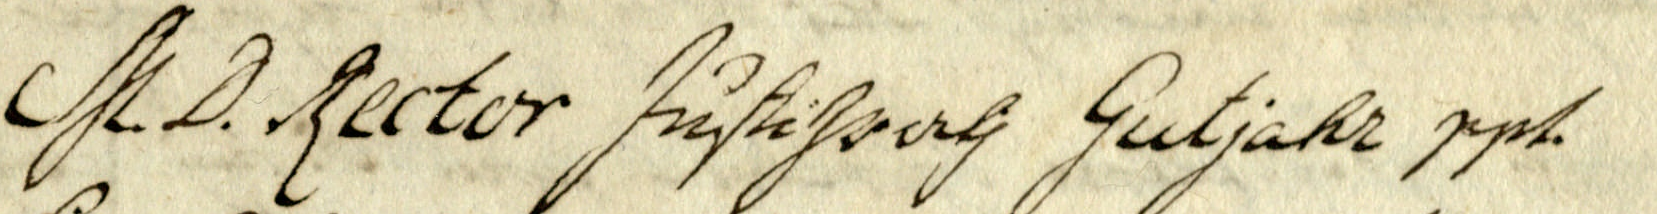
M. D. Rector Justizrath Gutjahr ppt.
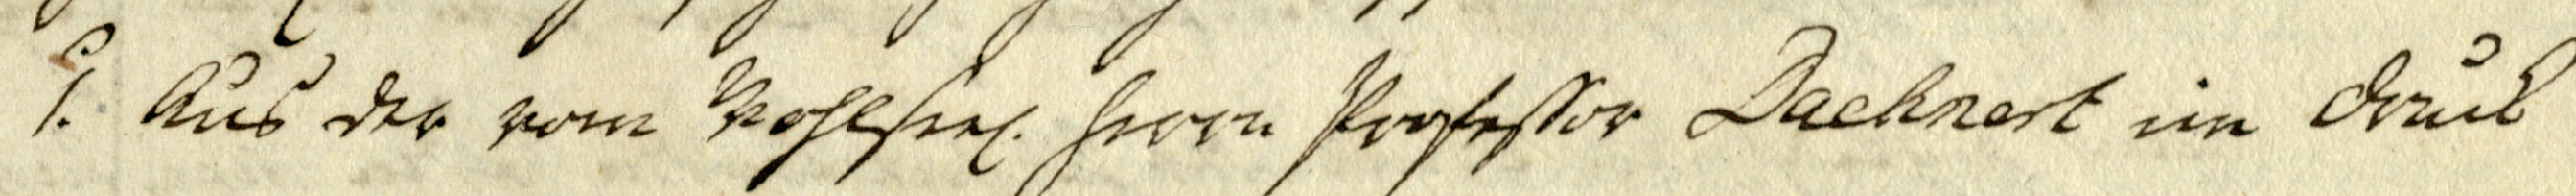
1. Aus der vom Wohlseel. herrn Professor Daehnert im Druck
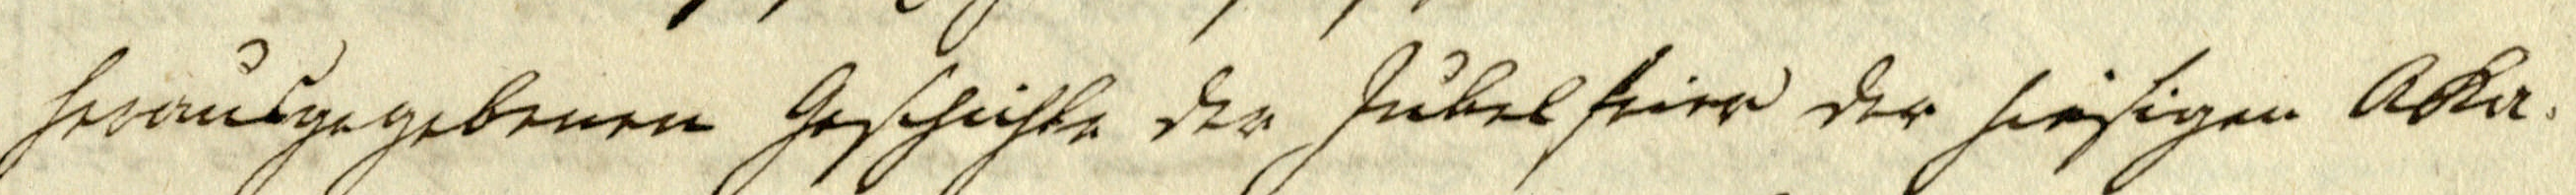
herausgegebenen Geschichte der Jubelfeier der hiesigen Aka¬
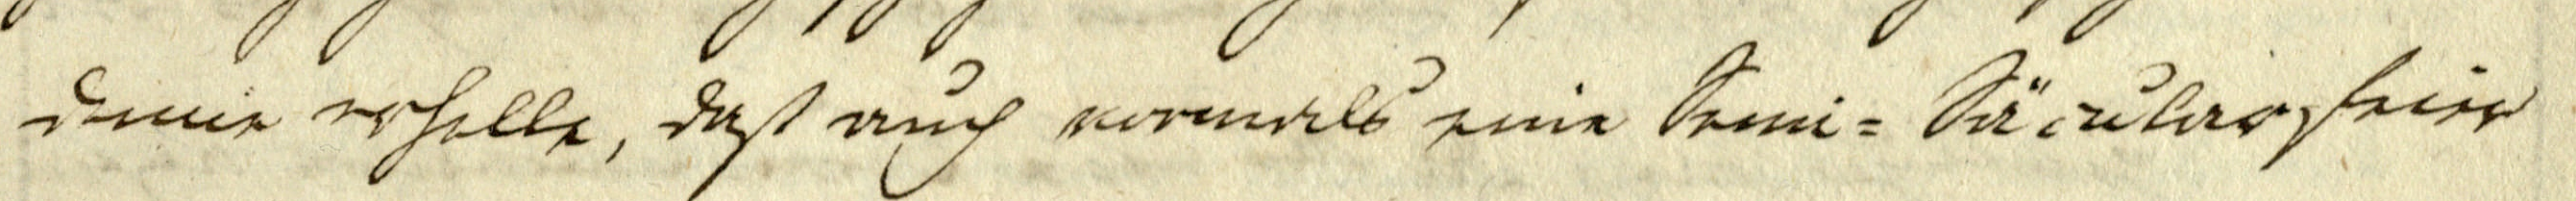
demie erhelle, daß auch vormals eine Semi-Säcularfeier
